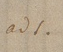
ad 1.
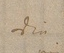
Die
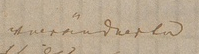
veränderte
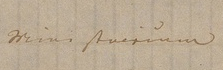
Ministerium –
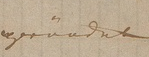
gründet
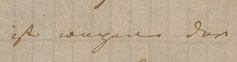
ist wegen der
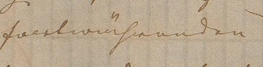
fortwährenden
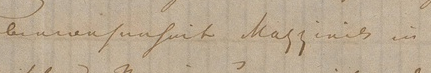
Anwesenheit Mazzinis in
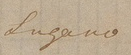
Lugano
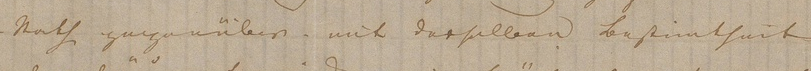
Rath gegenüber – mit derselben Bestimtheit
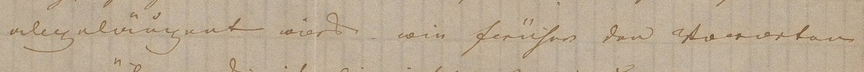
abgeläugnet wird – wie früher den Vororten
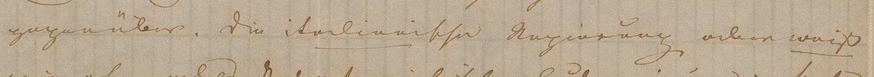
gegenüber. Die italienische Regierung aber weiß
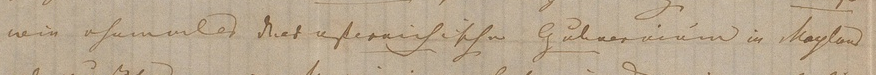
wie ehemals das östreichischeGubernium in Mayland
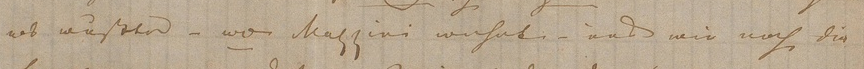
es wußte – woMazzini wohnt – und wie nah die
